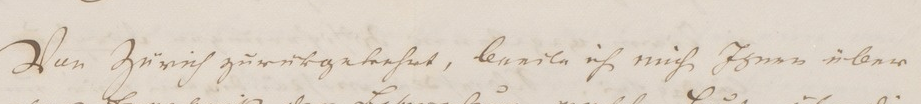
Von Zürich zurükgekehrt, beeile ich mich Ihnen über
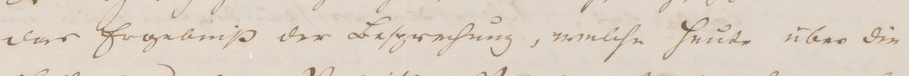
das Ergebniß der Besprechung, welche heute über die
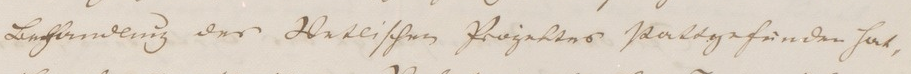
Behandlung des Wetlischen Projektes stattgefunden hat,
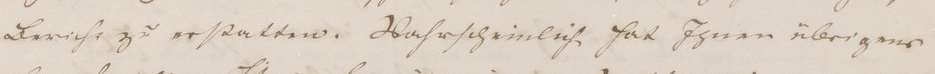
Bericht zu erstatten. Wahrscheinlich hat Ihnen übrigens
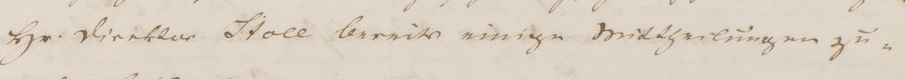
Hr. Direktor Stoll bereits einige Mittheilungen zu-
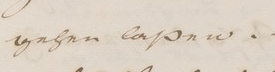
gehen laßen. –
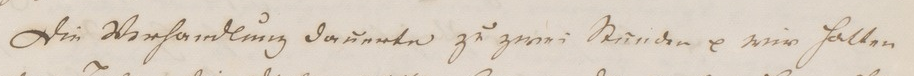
Die Verhandlung dauerte zu zwei Stunden & wir hatten
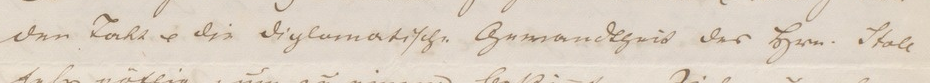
den Takt & die diplomatische Gewandtheit des Hrn. Stoll
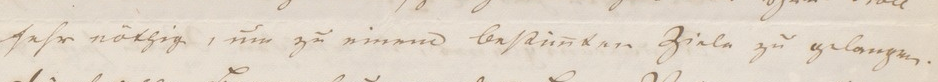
sehr nöthig, um zu einem bestimmten Ziele zu gelangen.
